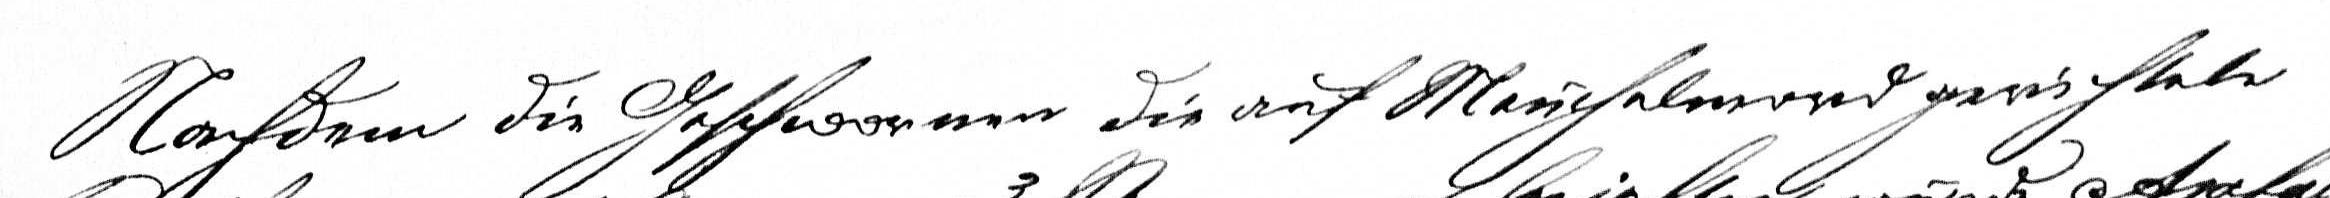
Nachdem die Geschworenen die auf Meuchelmord gerichtete
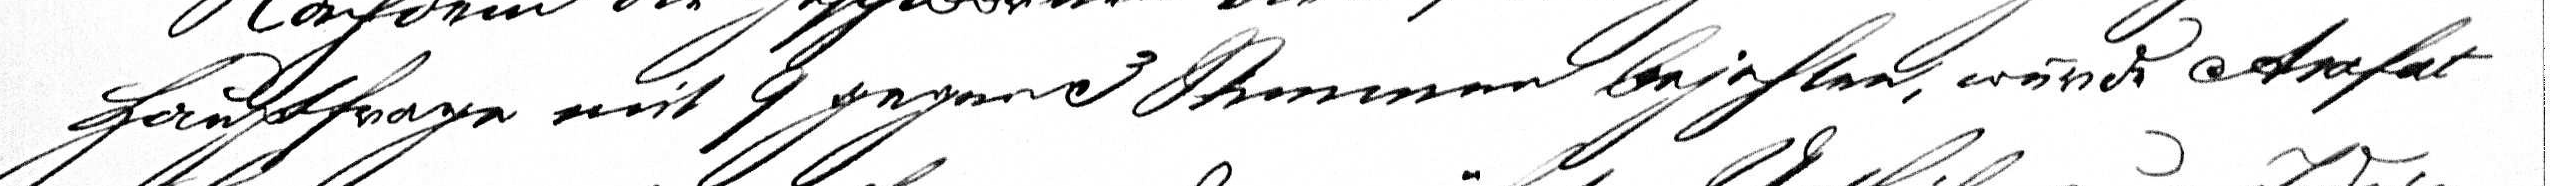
Hauptfrage mit 9 gegen 3 Stimmen bejahten, wurde Arafat
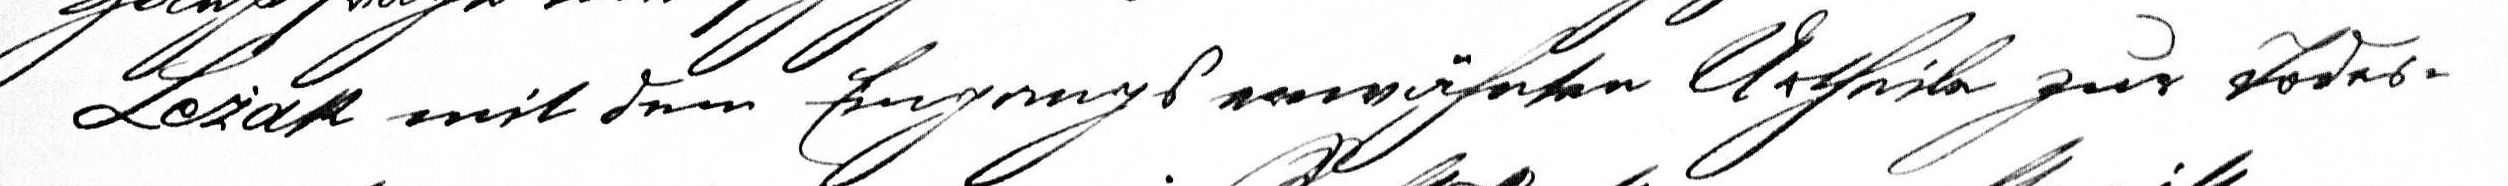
Leżakmit dem Eingangserwähnte Urtheile zur Todes¬
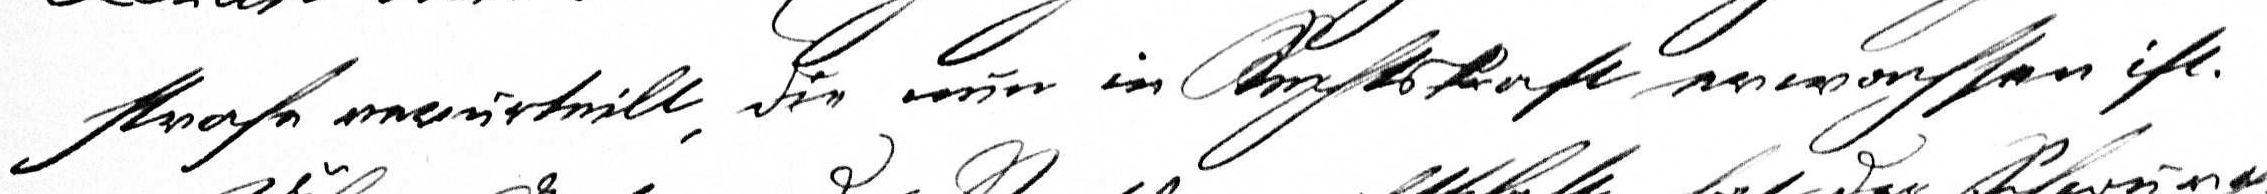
strafe verurtheilt, die nun in Rechtskraft erwachsen ist.
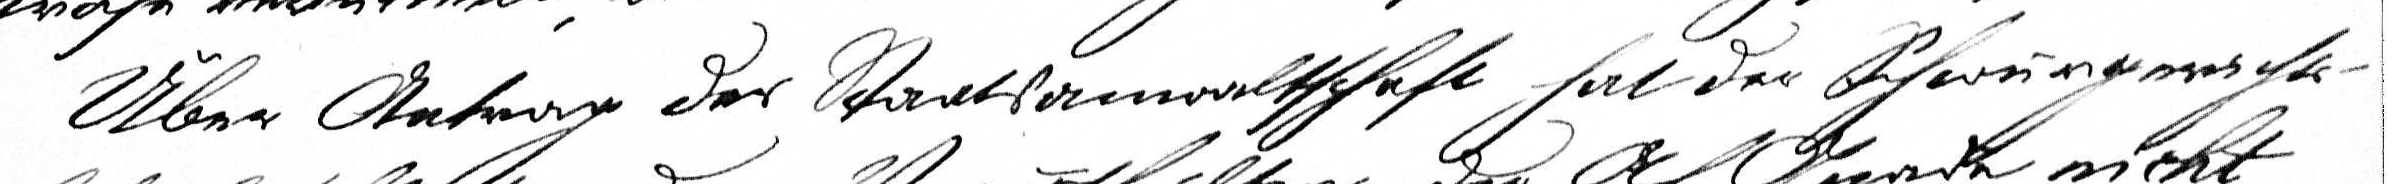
Über Antrag der Staatsanwaltschaft hat der Schwurgerichts¬
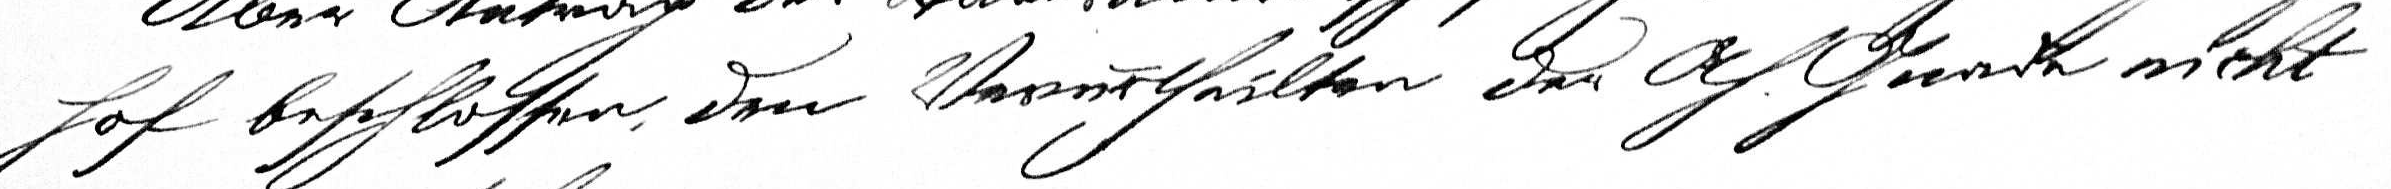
hof beschlossen, den Verurtheilten der Ah Gnade nicht
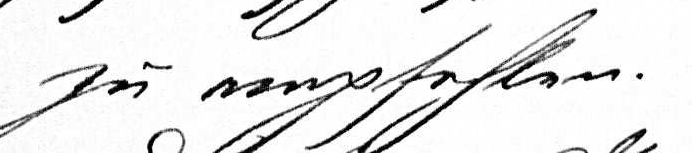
zu empfehlen.
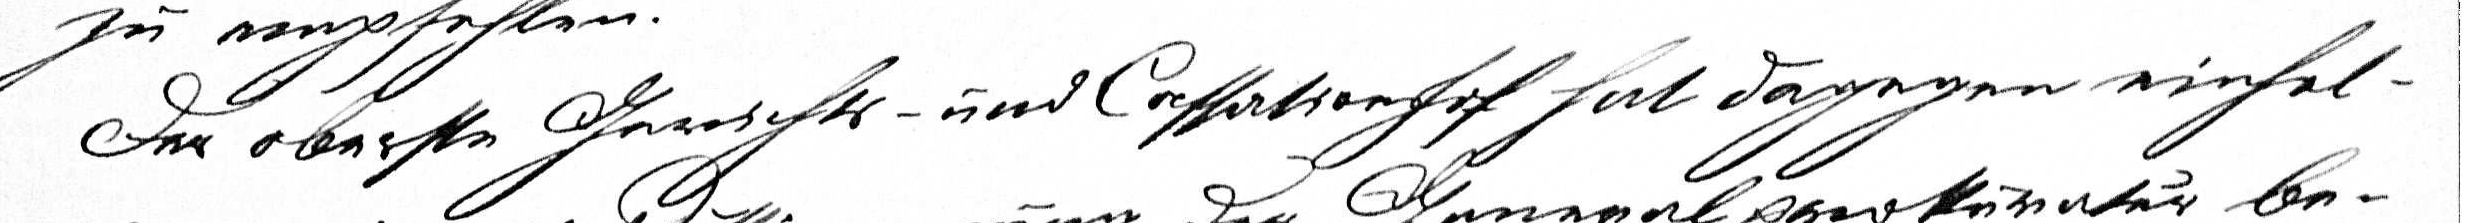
Der oberste Gerichts- und Cassationshof hat dagegen einhel¬
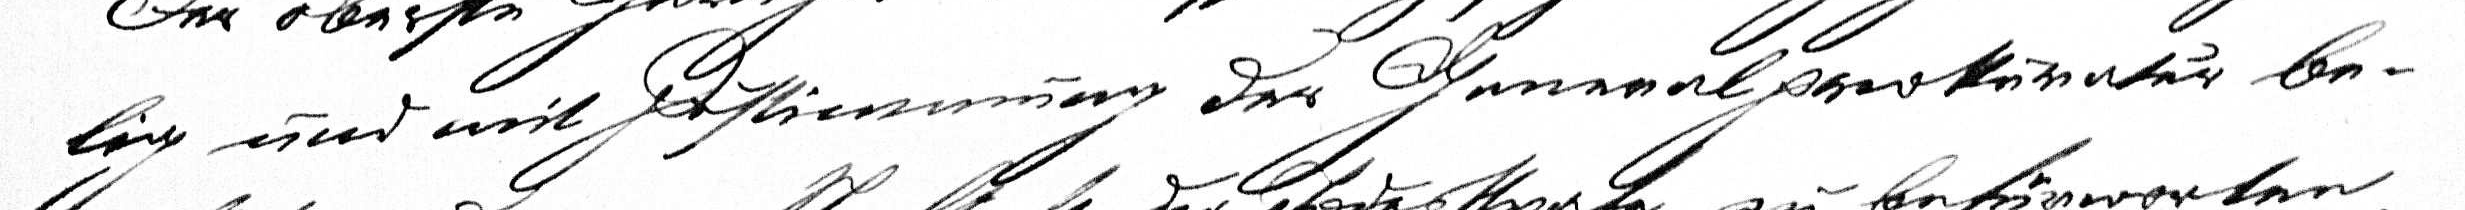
lig und mit Zustimmung der Generalprokuratur be¬
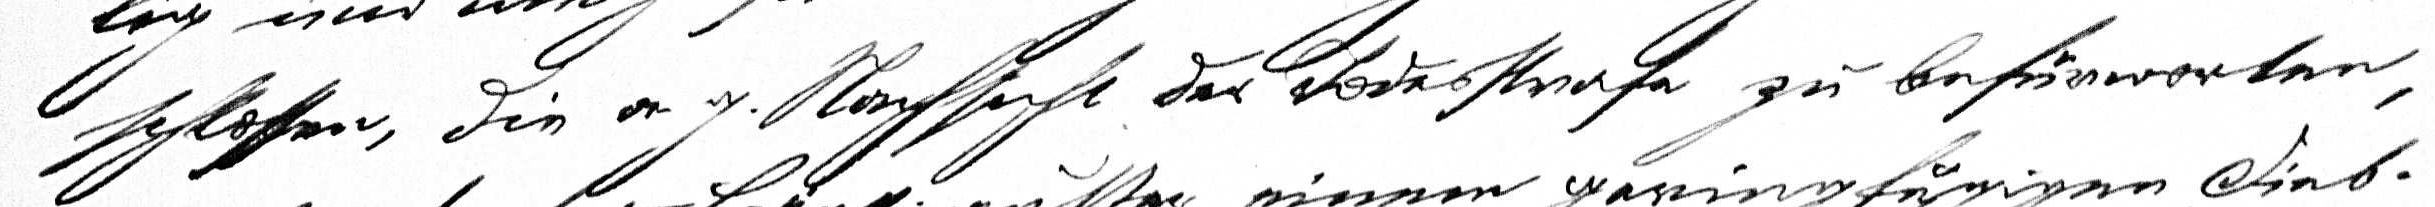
schlossen, die a.g. Nachsicht der Todesstrafe zu befürwroten
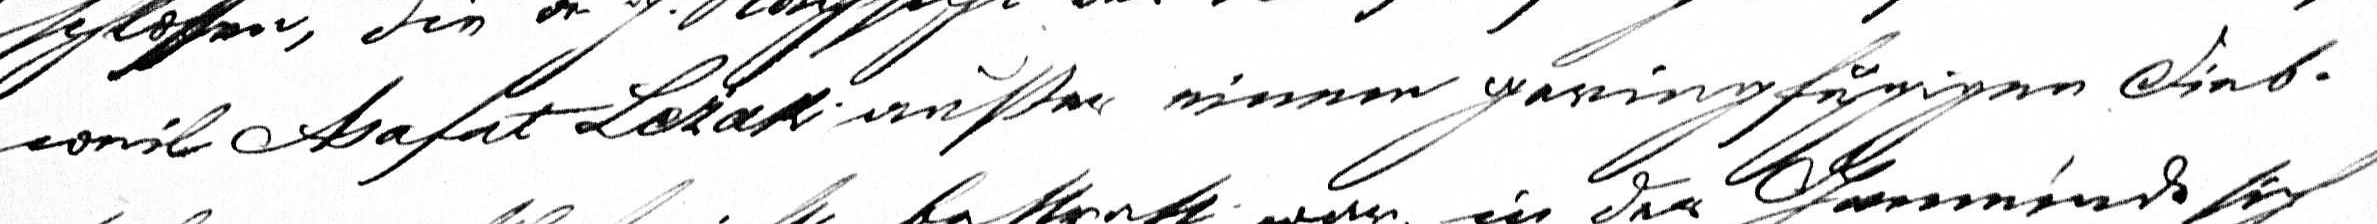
weil Asafat Leżak außer einen geringfügigen Dieb¬
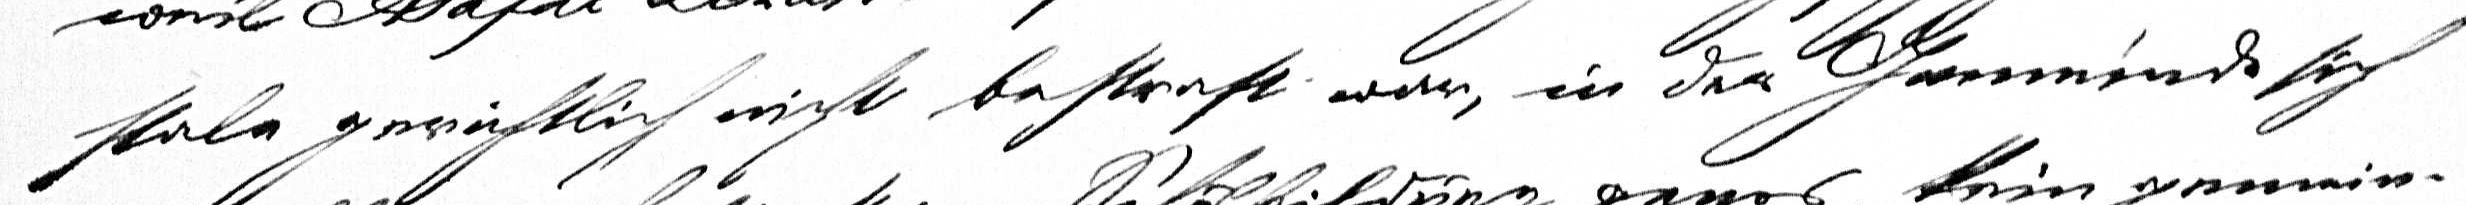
stale gerichtlich nicht bestraft war, in der Gemeinde sich
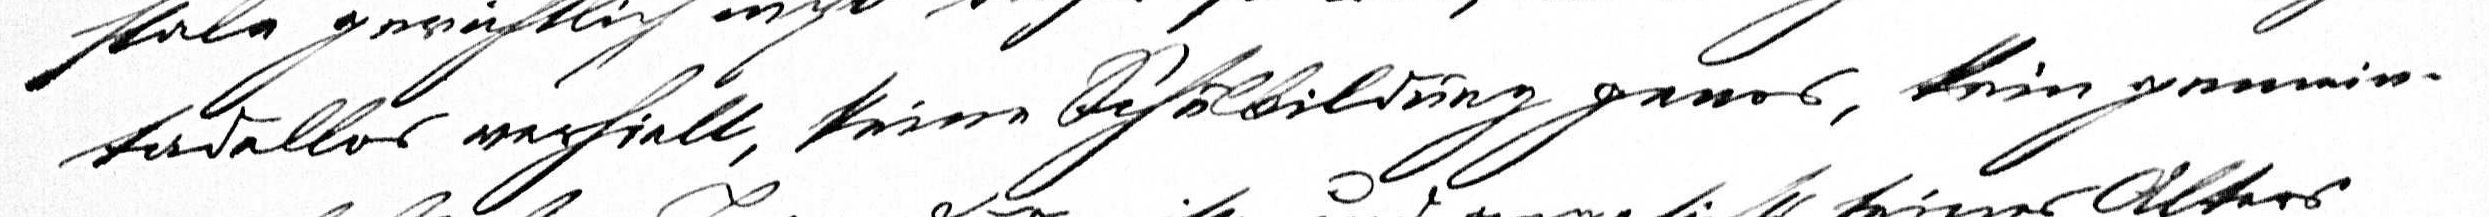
tadellos verhielt, keine Schulbildung genos, kein gemein¬
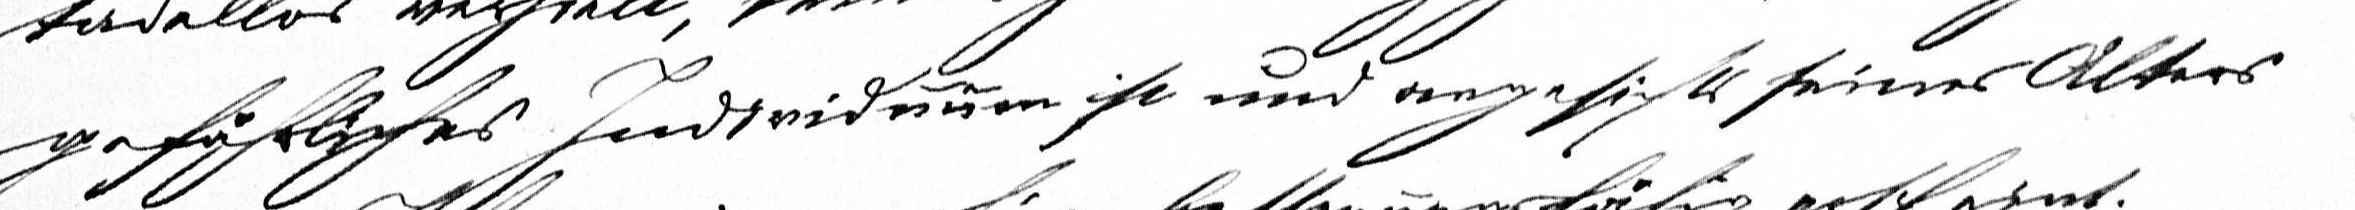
gefährliches Individuum ist und angesichts seines Alters
